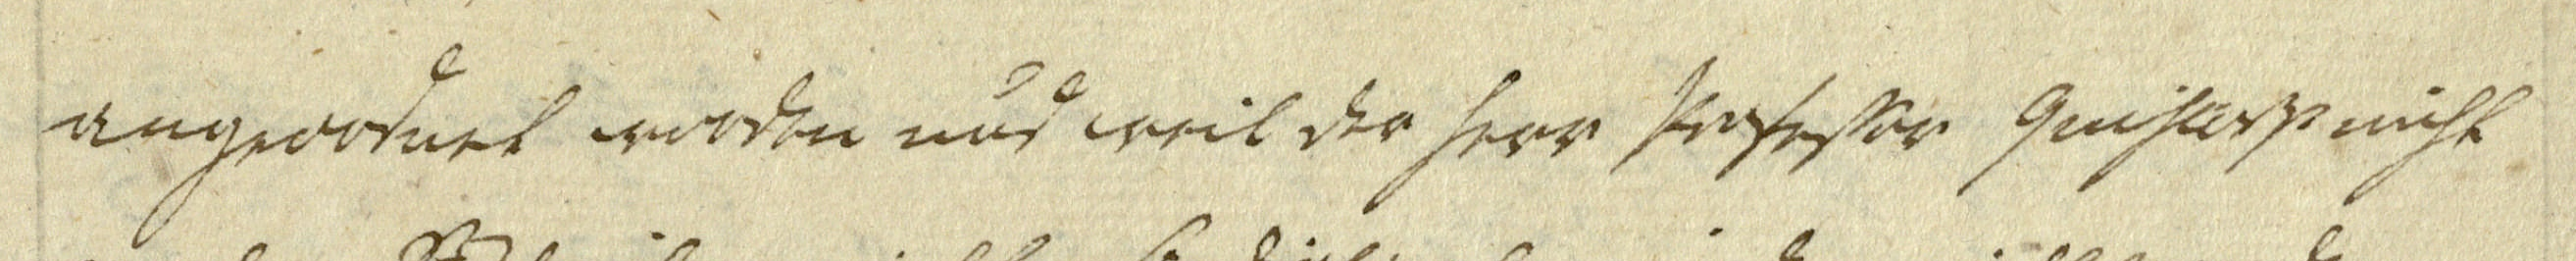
angeordnet worden und weil der Herr Professor Quistorp nicht
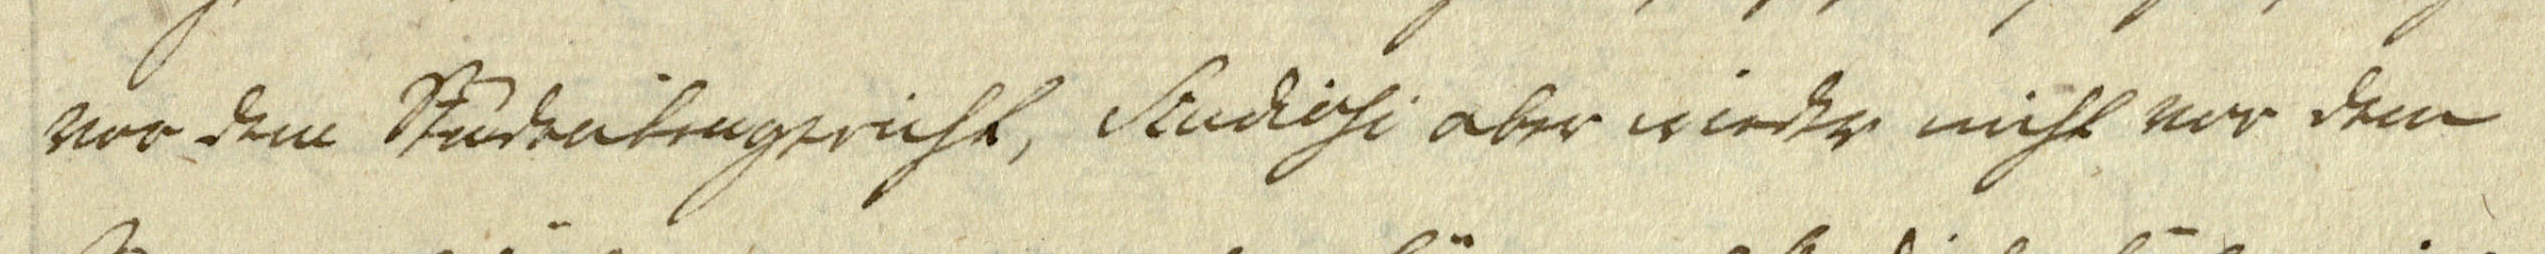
vor dem Studentengericht, Studiosi aber wieder nicht vor dem
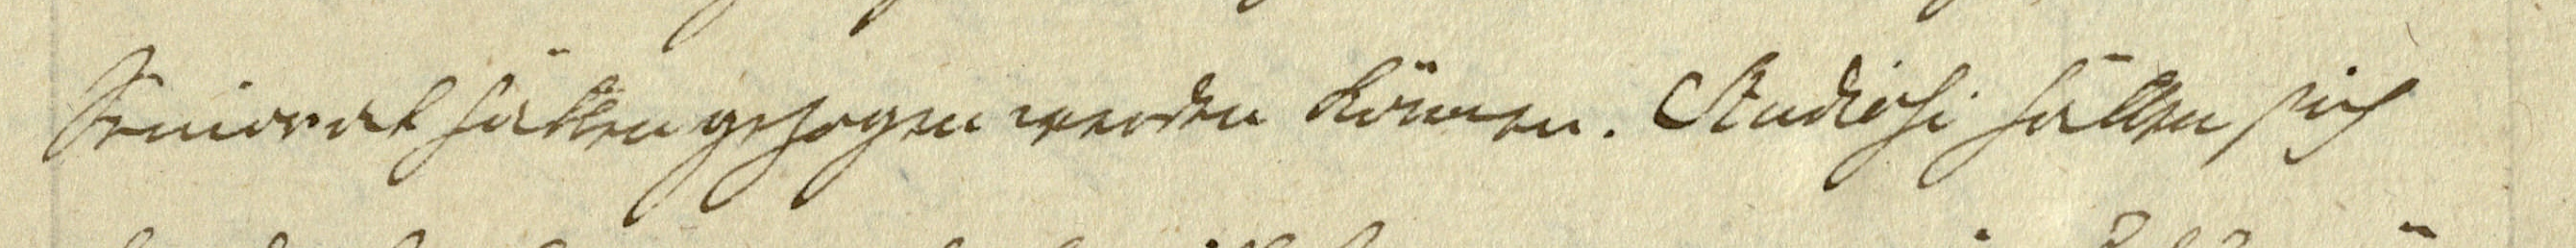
Seniorat hätten gezogen werden können. Studiosi hätten sich
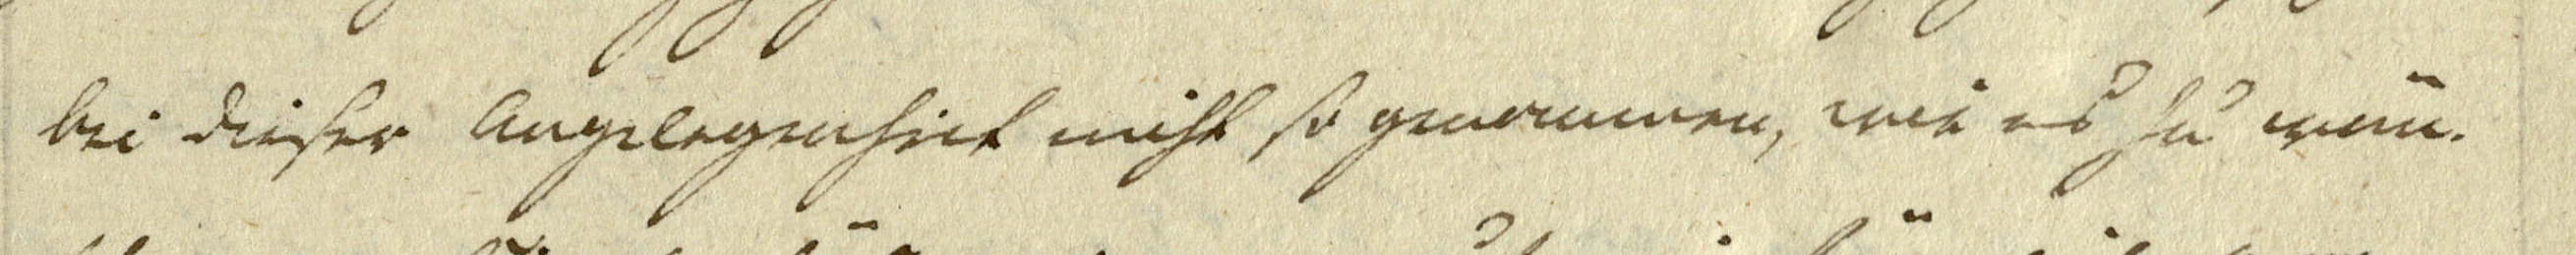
bei dieser Angelegenheit nicht so genommen, wie es zu wün¬
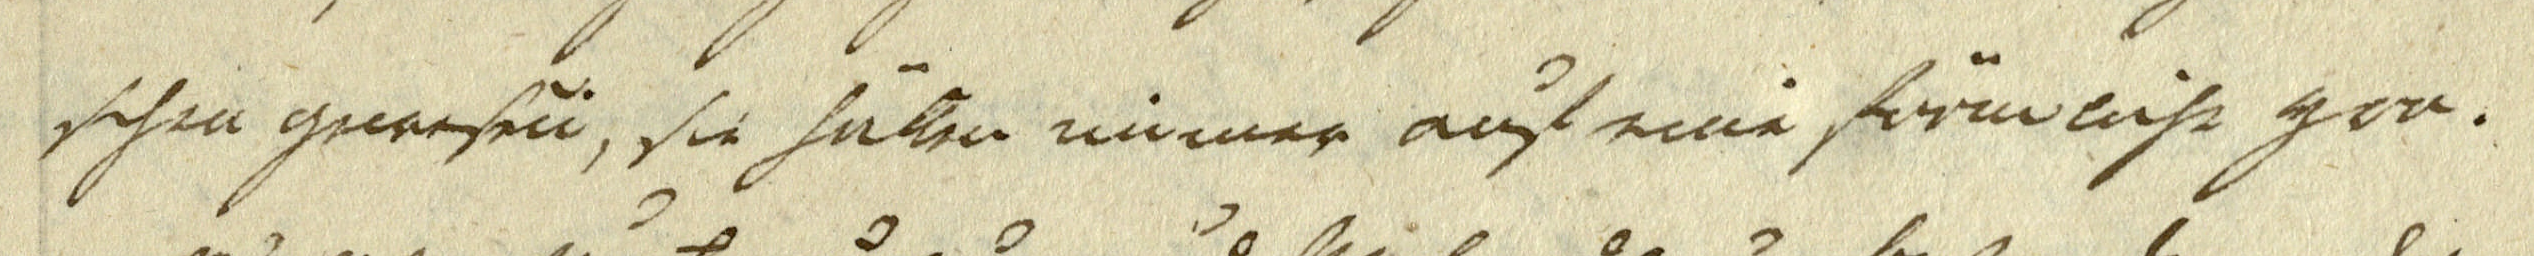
schen gewesen, sie hätten immer auf eine förmliche pro¬
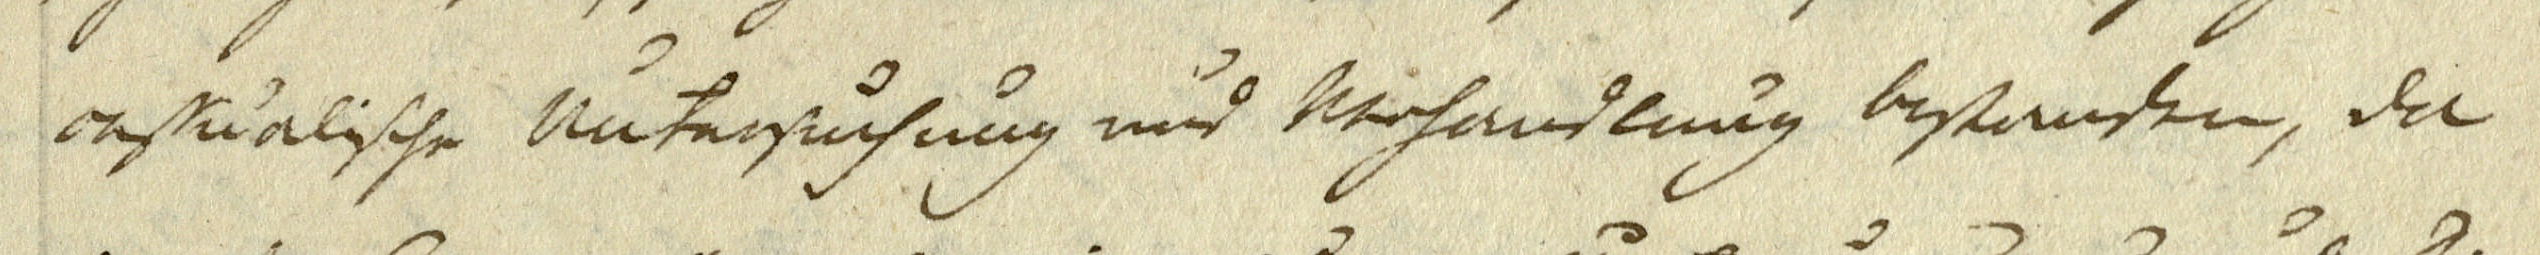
cessualische Untersuchung und Verhandlung bestanden, da
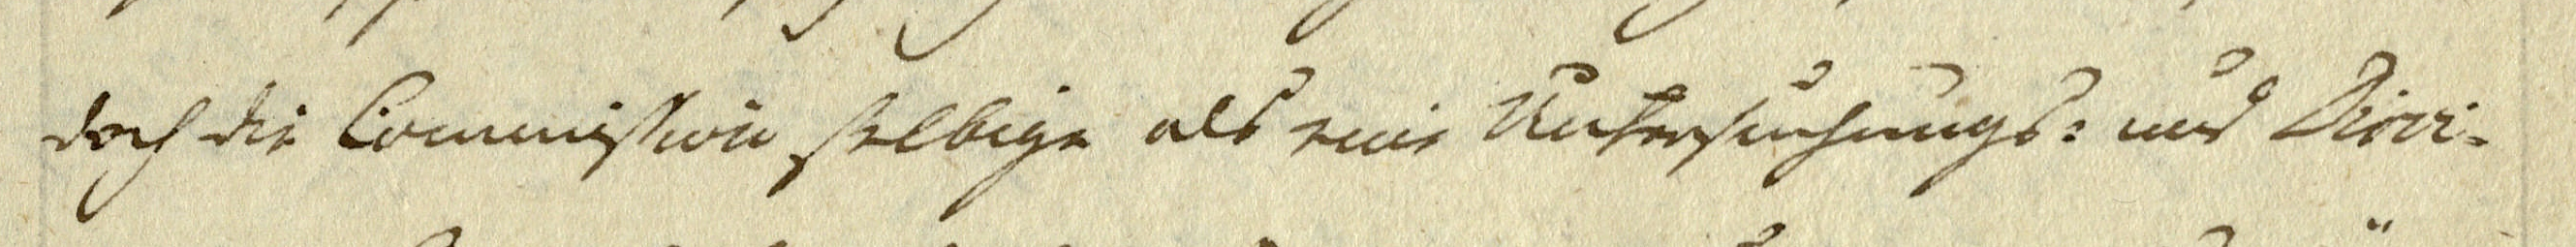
doch die Commission selbige als eine Untersuchungs- und Disci¬
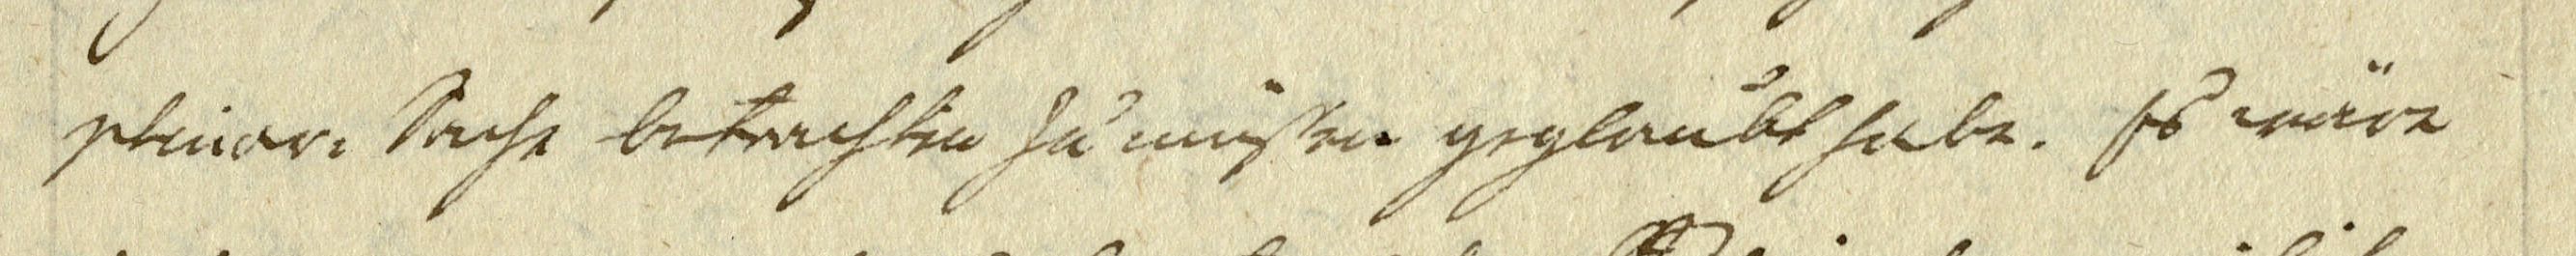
plinar- Sache betrachten zu müssen geglaubt habe. Es wäre
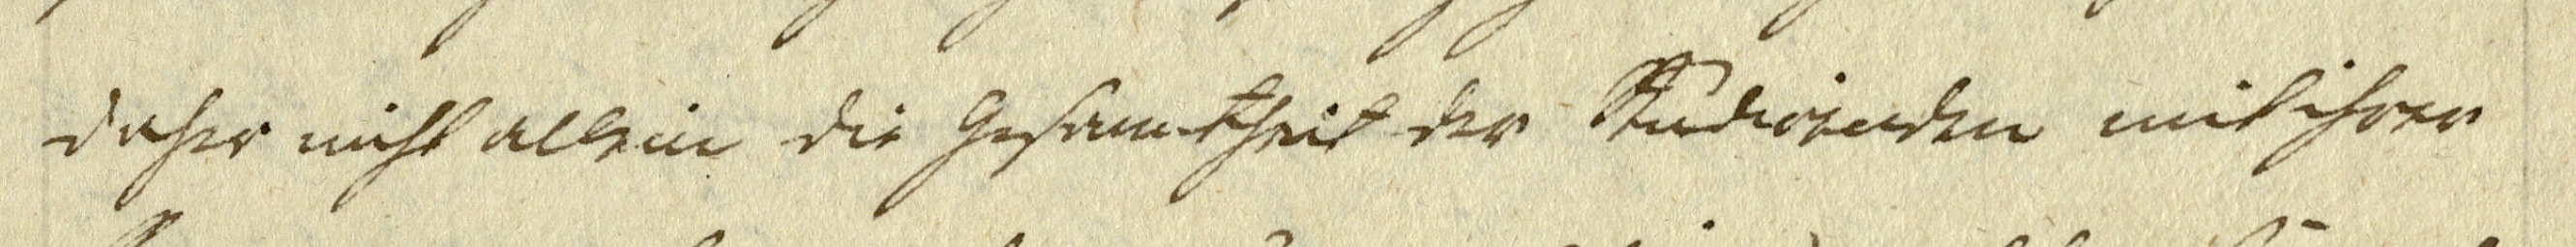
daher nicht allein die Gesamtheit der Studirenden mit ihrer
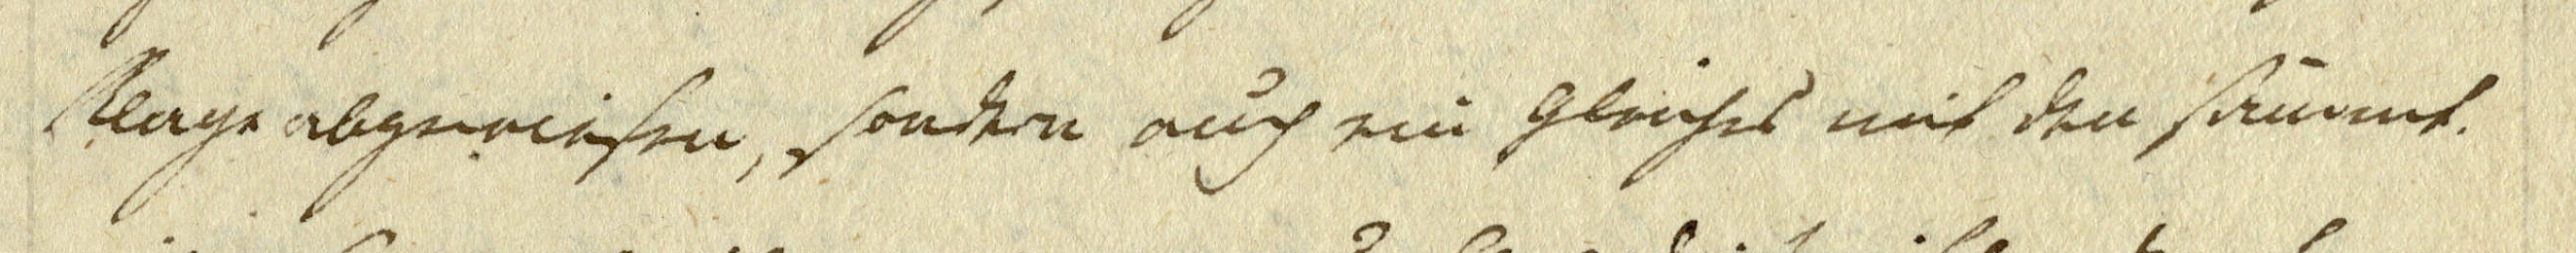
Klage abgewiesen, sondern auch ein gleiches mit den sämmt¬
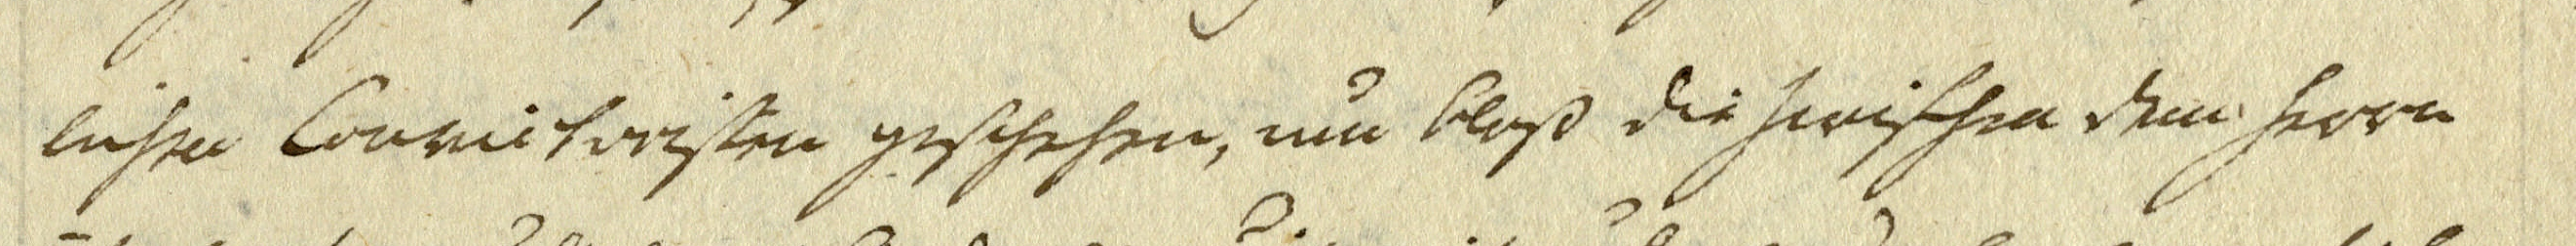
lichen Convictoristen geschehen, um bloß die zwischen dem Herrn
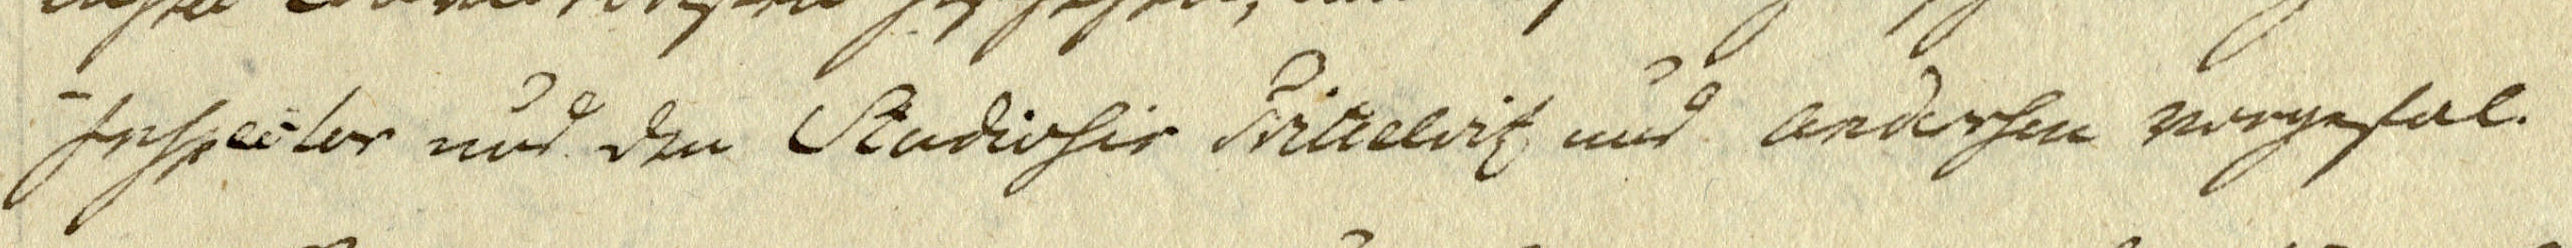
Inspector und den Studiosis Trittelvitz und Andersen vorgefal¬
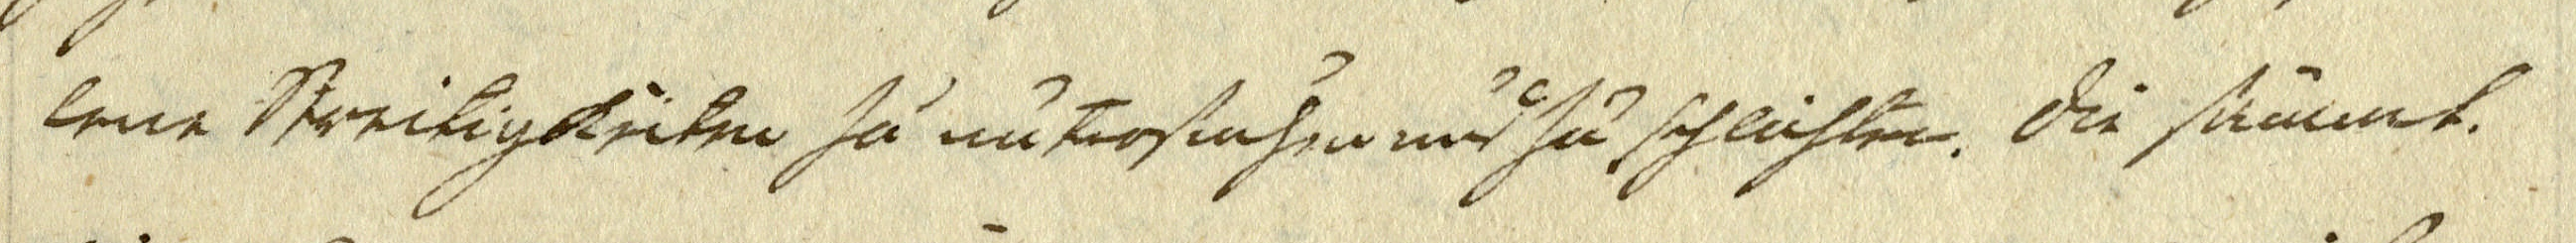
lene Streitigkeiten zu untersuchen und zu schlichten. Die sämmt¬
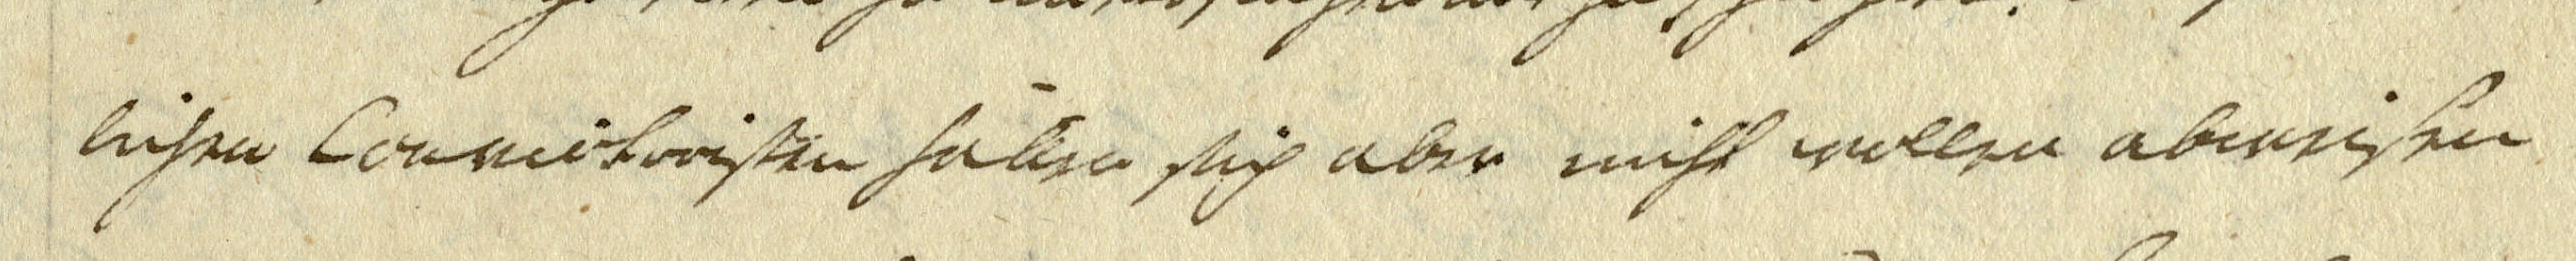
lichen Convictoristen haben sich aber nicht wollen abweisen
